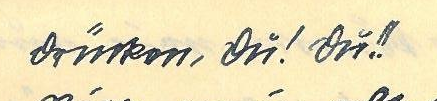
drücken, Du! Du!!
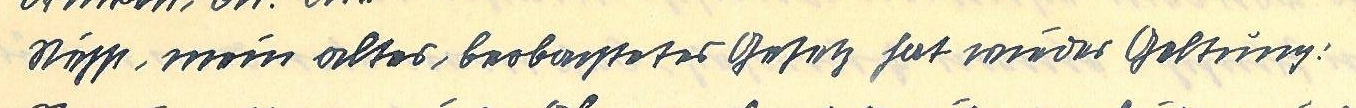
Siehst, mein altes, beobachtetes Gesetz hat wieder Geltung:
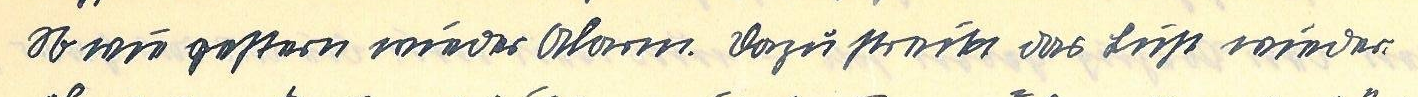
So wie gestern wieder Alarm. Dazu streikt das Licht wieder.
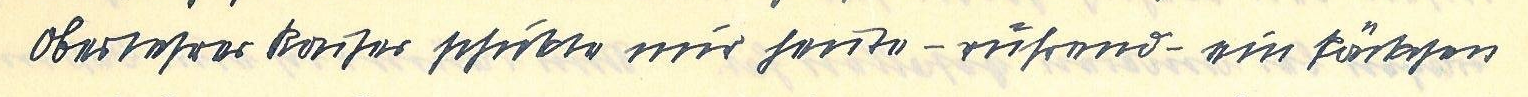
Oberlehrer K. schickte mir heute – rührend – ein Päckchen
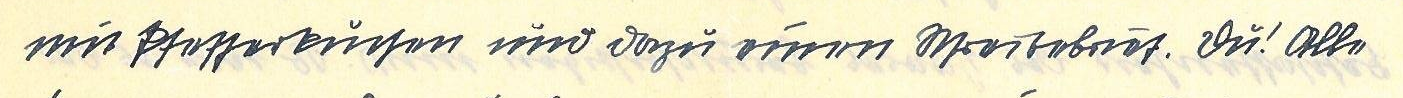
mit Pfefferkuchen und dazu einen Schreibebrief. Du! Alle
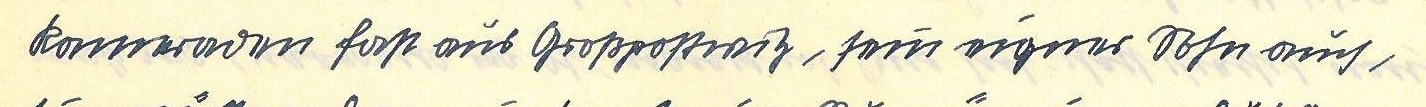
Kameraden fast aus G., sein eigener Sohn auch,
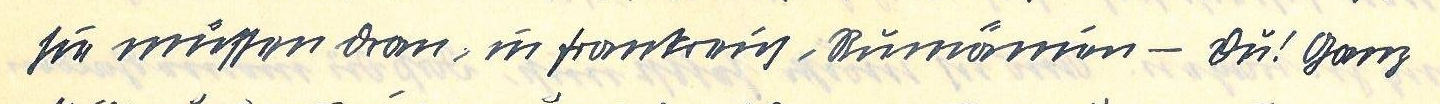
sie müssen dran, in Frankreich, Rumänien — Du! Ganz
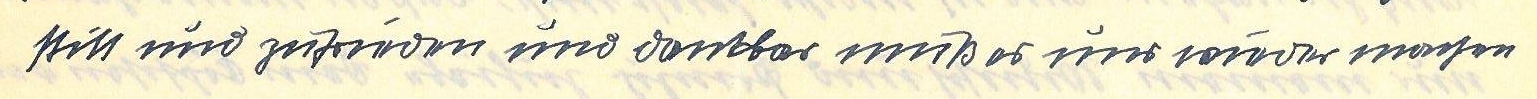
still und zufrieden und dankbar muß es uns wieder machen
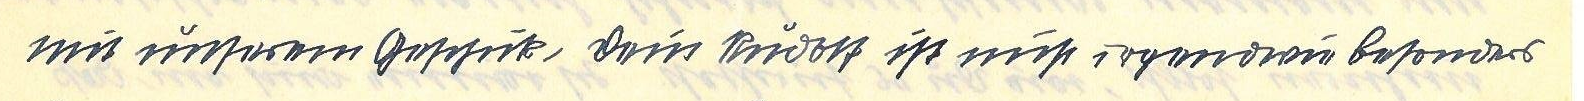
mit unserem Geschick, Dein ist nicht irgendwie besonders
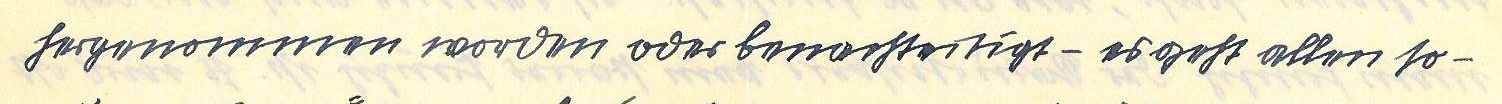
hergenommen worden oder benachteiligt – es geht allen so –
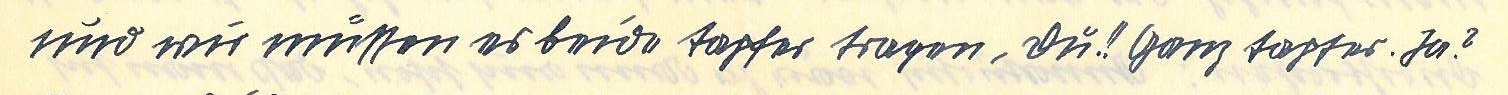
und wir müssen es beide tapfer tragen, Du!! Ganz tapfer. Ja?
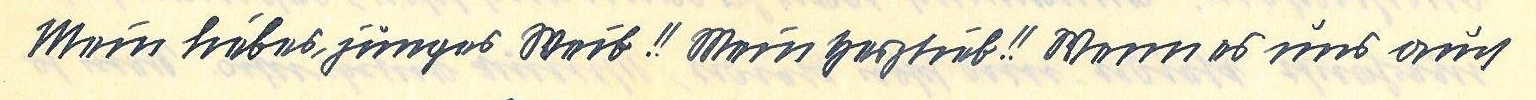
Mein liebes, junges Weib!! Mein Herzlieb!! Wenn es uns auch
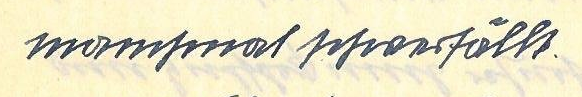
manchmal schwerfällt.
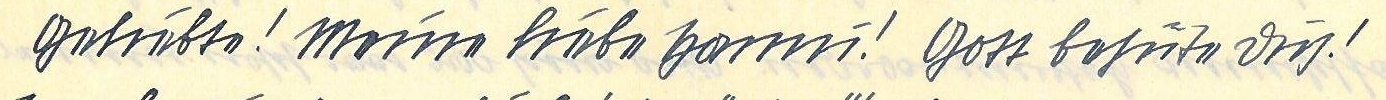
Geliebte! Meine liebe! Gott behüte Dich!
